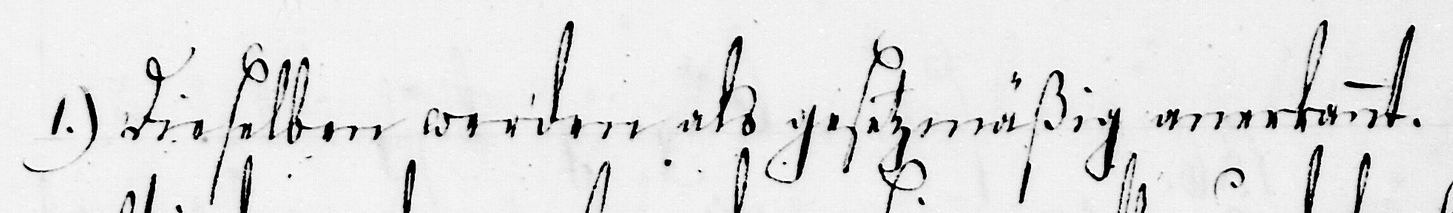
1.) Dieselben werden als gesetzmäßig anerkannt.
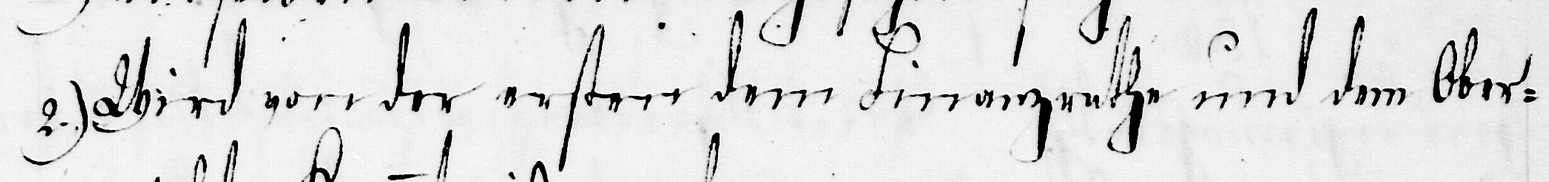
2.) Wird von der ersten dem Finanzrathe und dem Ober¬
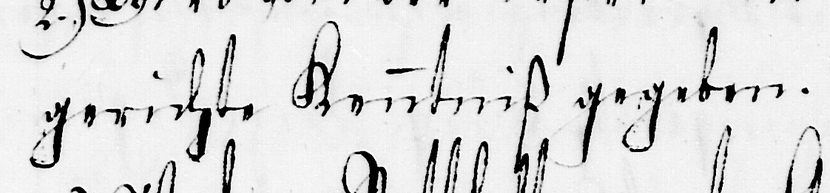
gerichte Kenntniß gegeben.
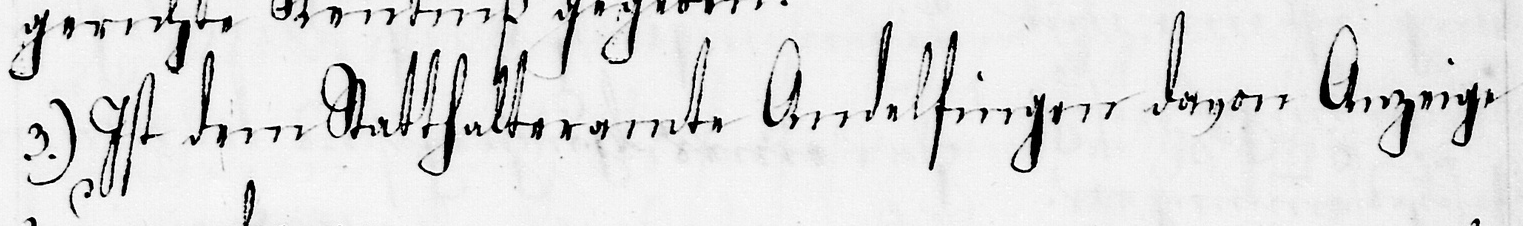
3.) Ist dem Statthalteramte Andelfingen davon Anzeige
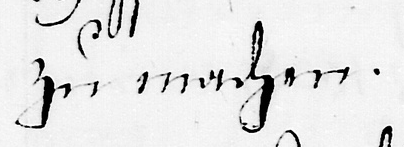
zu machen.
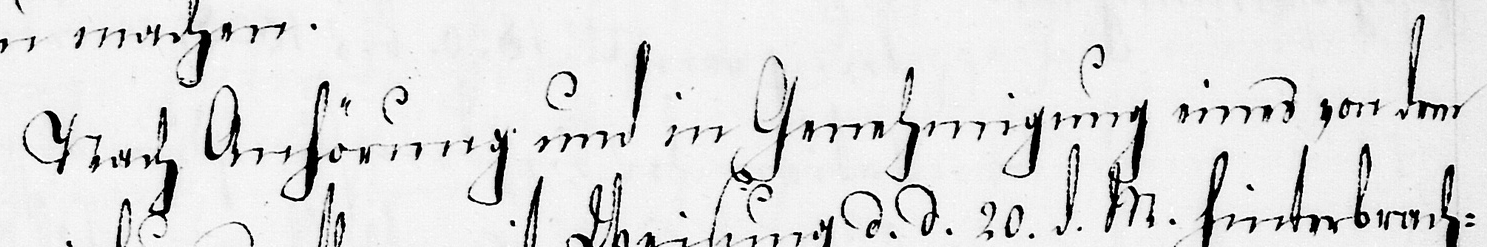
Nach Anhörung und in Genehmigung eines von dem
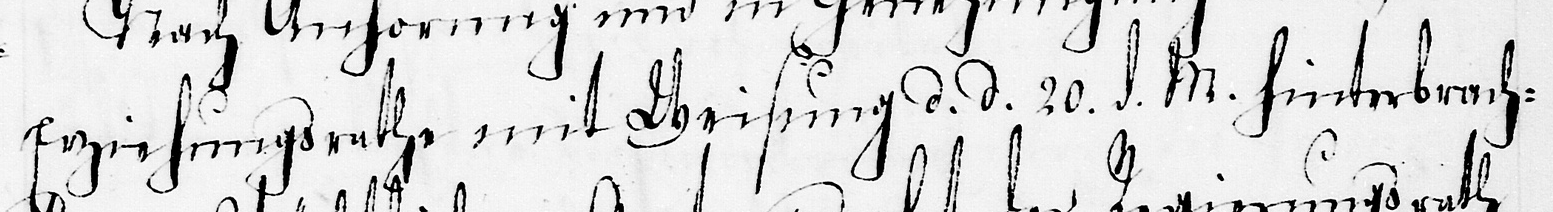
Erziehungsrathe mit Weisung d. d. 20. d. M. hinterbrach¬
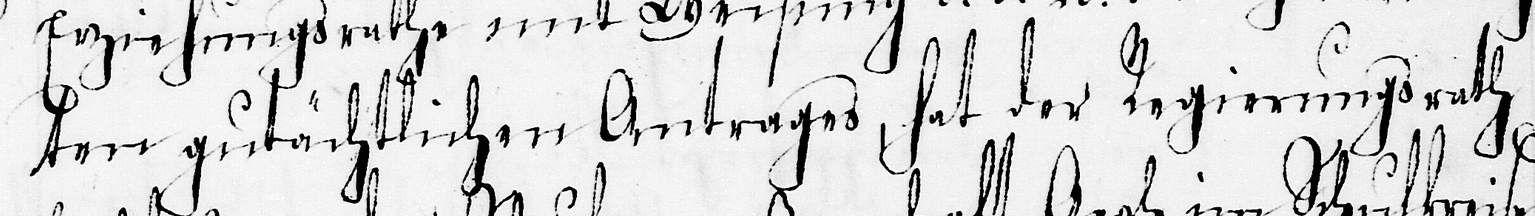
ten gutächtlichen Antrages, hat der Regierungsrath
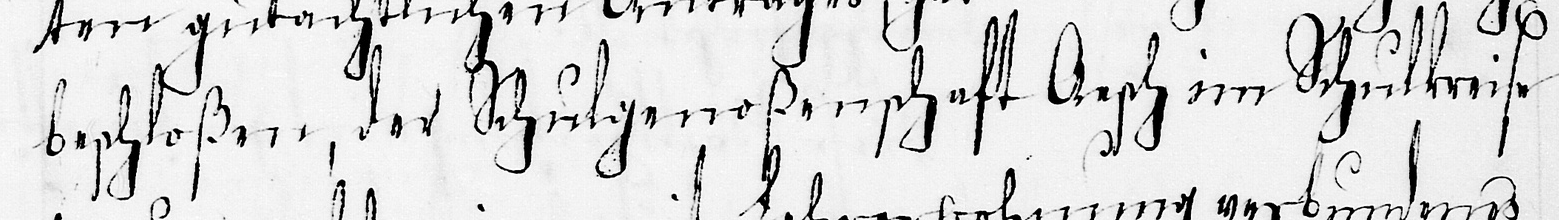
beschloßen, der Schulgenoßenschaft Aesch im Schulkreise
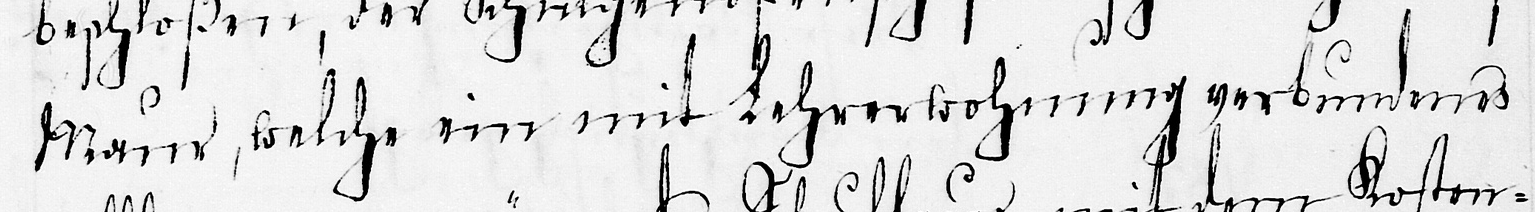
Maur, welche ein mit Lehrerwohnung verbundenes
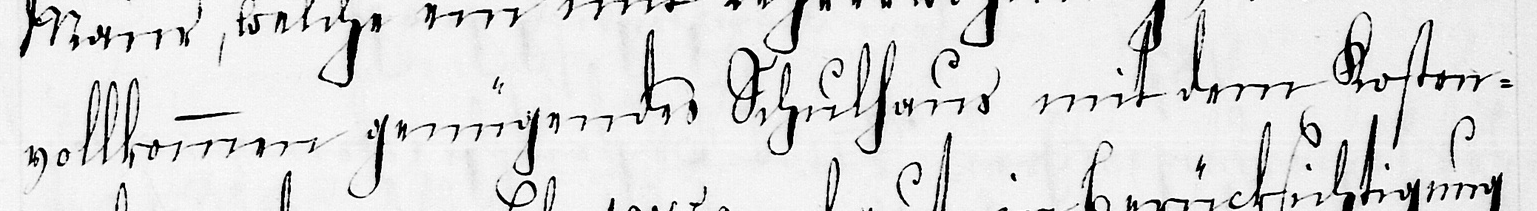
vollkommen genügendes Schulhaus mit dem Kosten¬
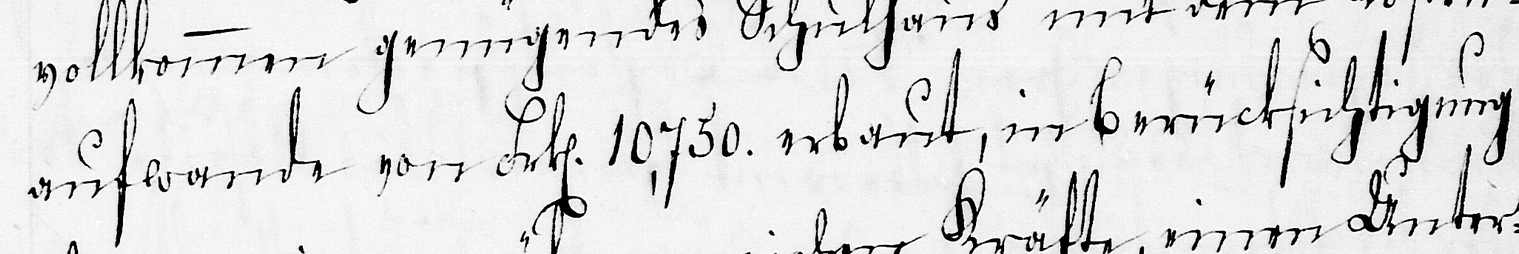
aufwande von Frk[en]. 10,750. erbaut, in Berücksichtigung
